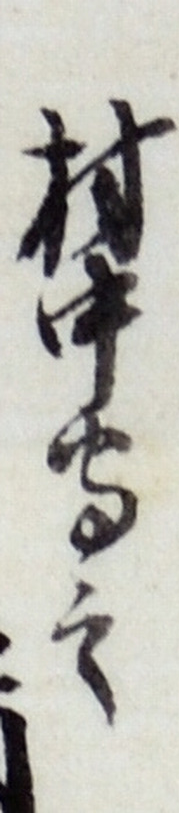村中守之
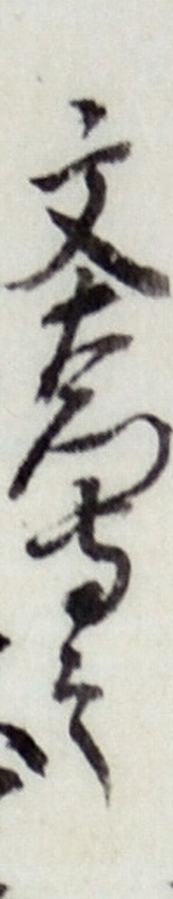文右衛門守之
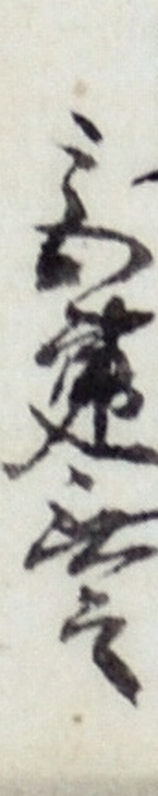宮建無之
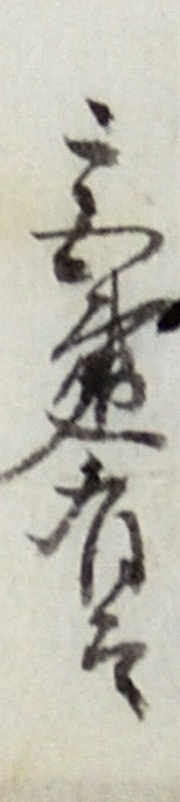宮建有之
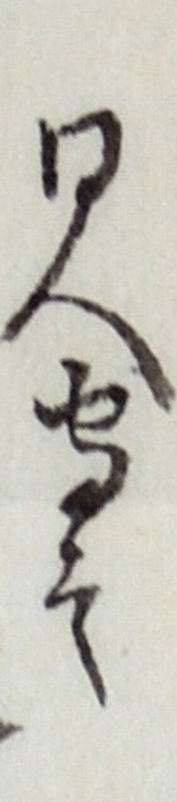同人守之
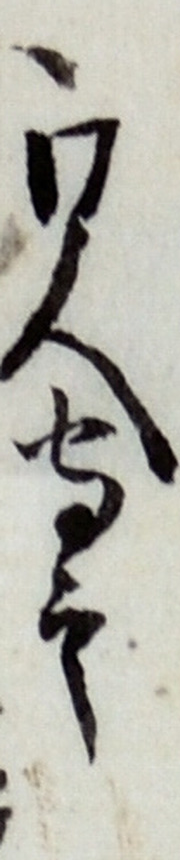同人守之
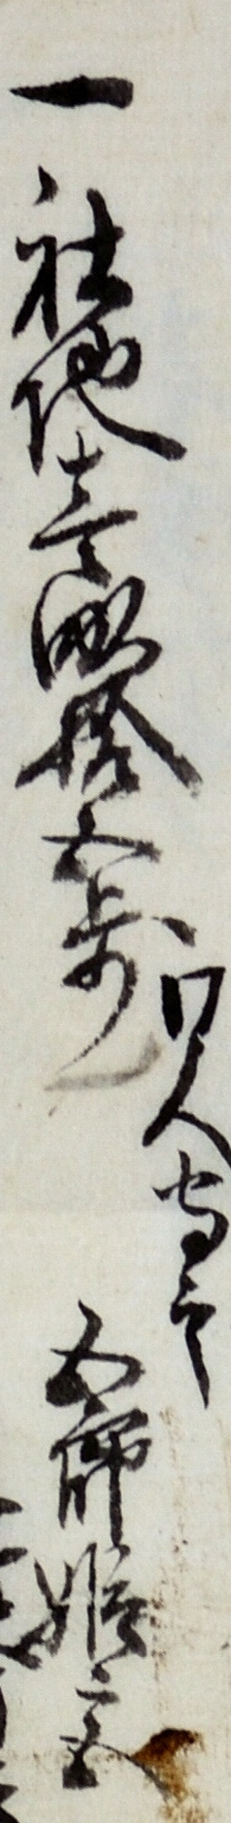一社地壱畝拾五歩五郎姫宮
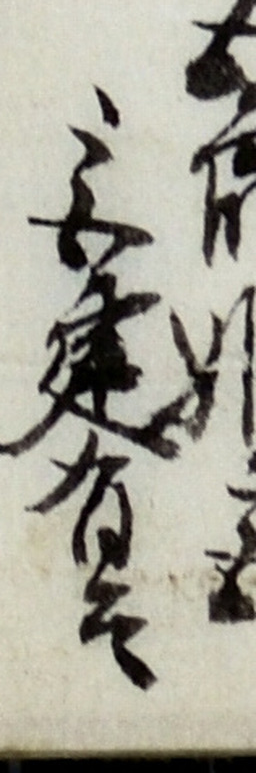宮建有之
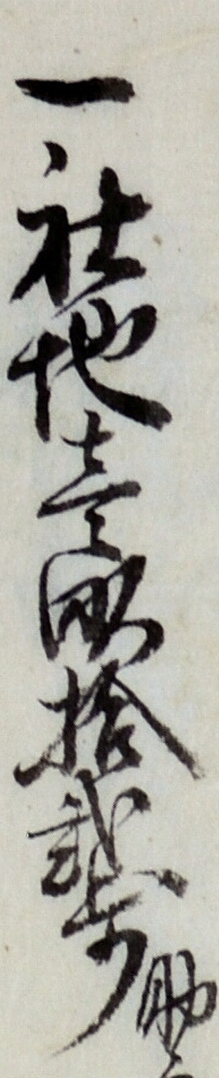一社地壱畝拾弐歩八幡
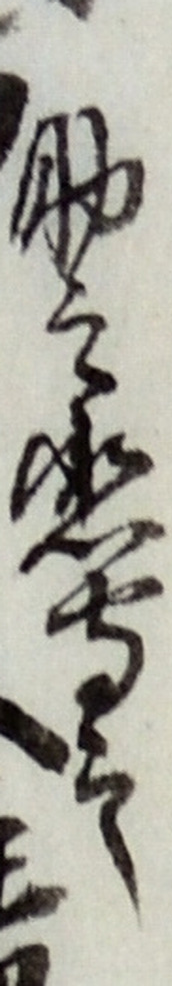助之丞守之
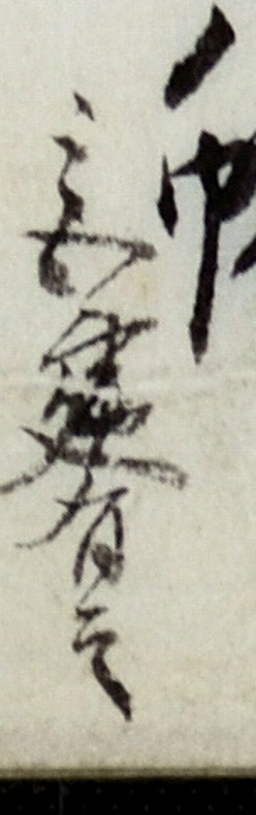宮建有之
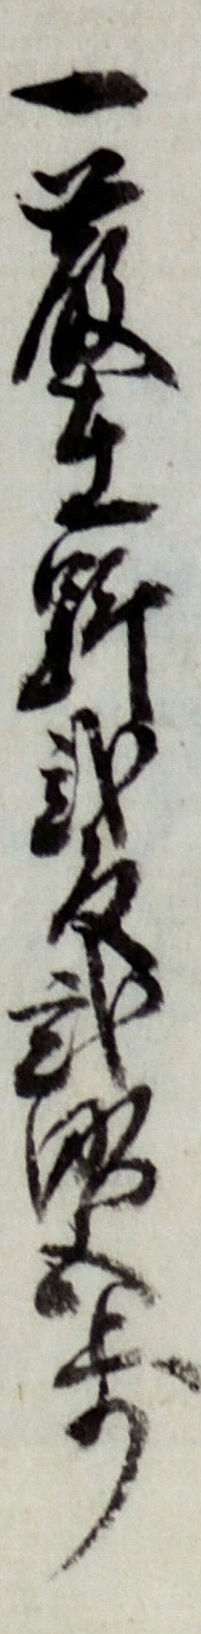一散在野弐反弐畝五歩

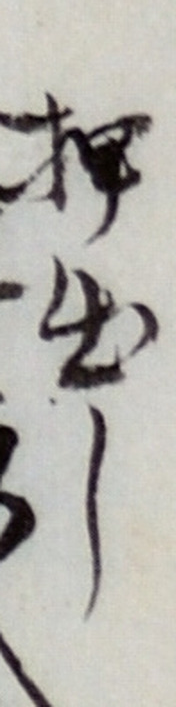押出し
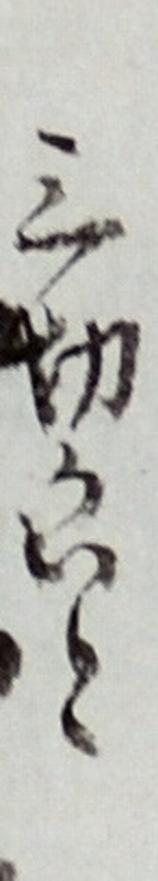三切かいと
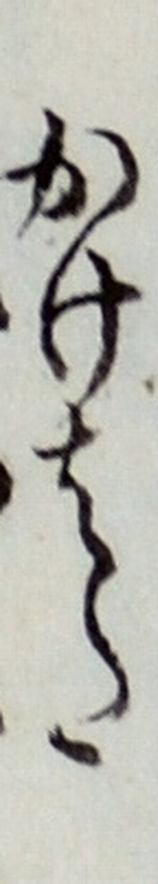かけはた
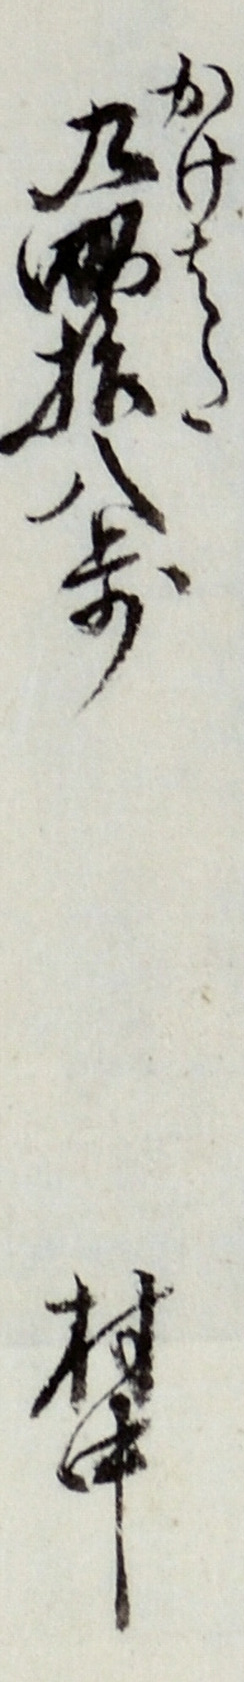九畝拾八歩村中
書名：御領分中山林社地手控
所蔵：伊那市立高遠町図書館・合同会社AMANE
